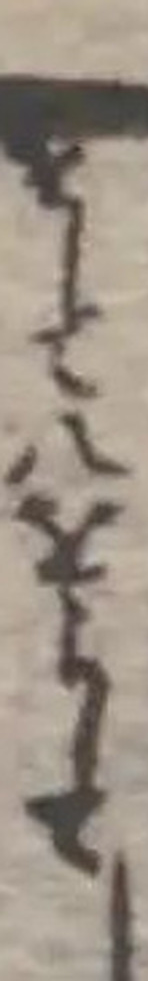そして八をよして
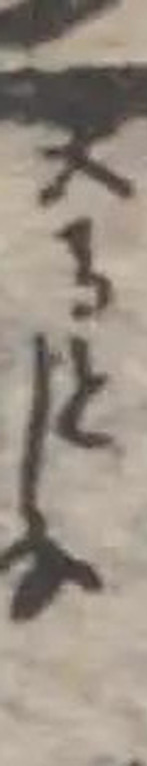大間としな
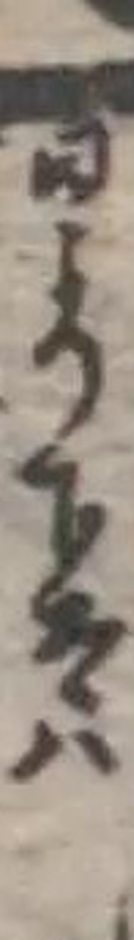日より下太は
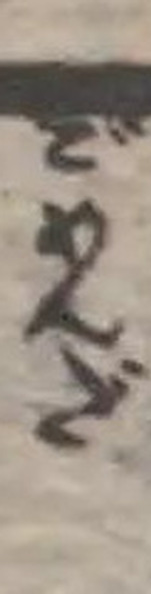ごめんだ

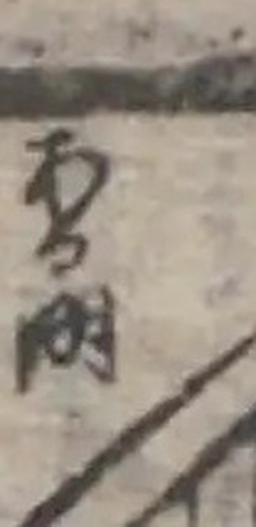ある時
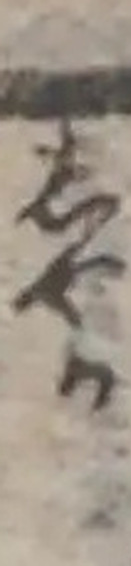しやか
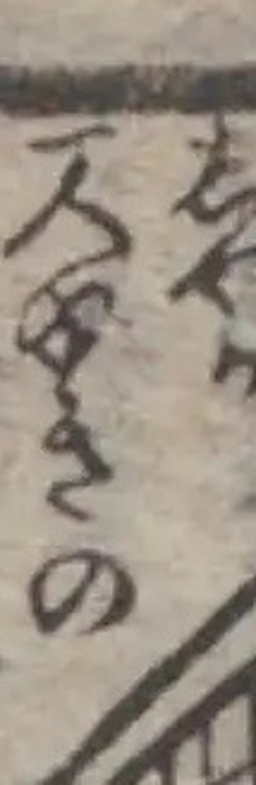一人ゆきの
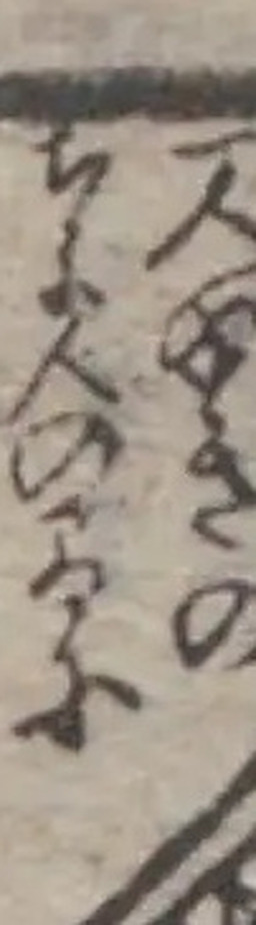ちよんの間に
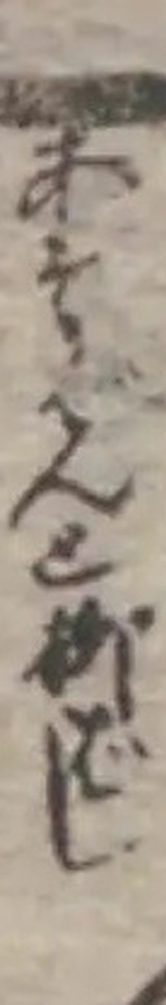あそばんと梅ばし
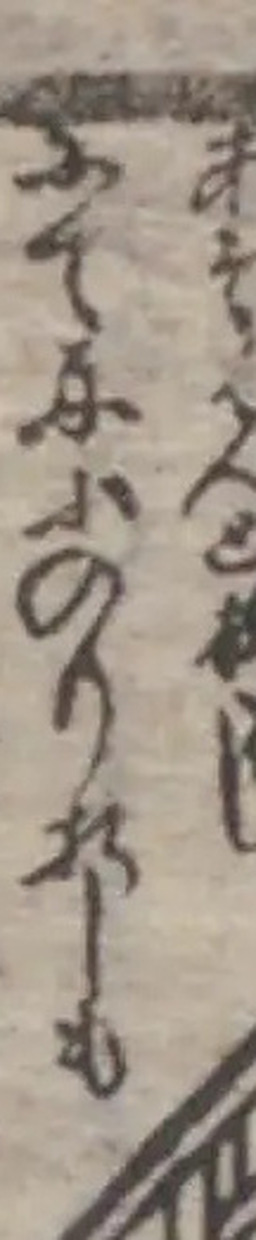にて舟にのり折しも
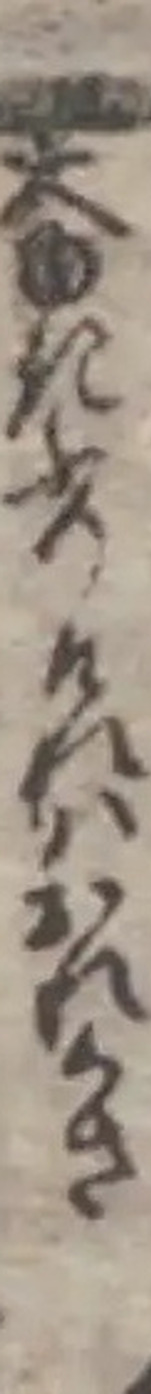大ゆきふりけれはおれかさ
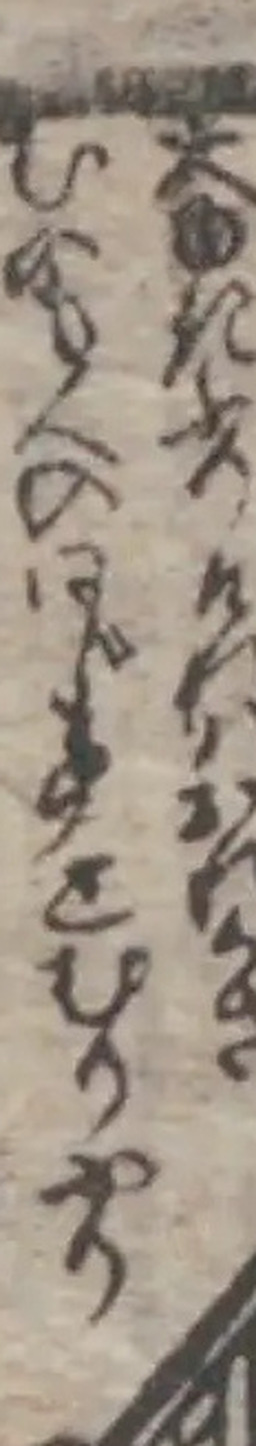むいも人のはじ事とむりやり
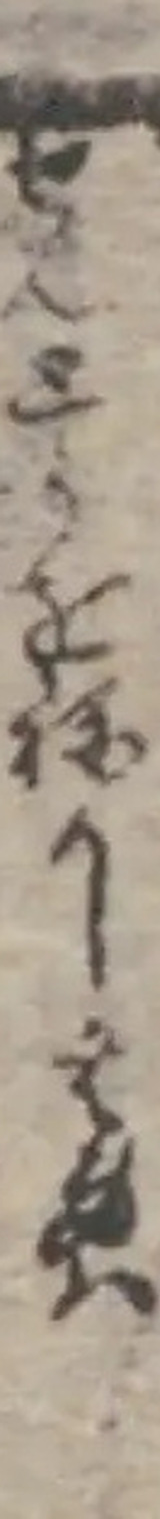せんとうをねかし其身は
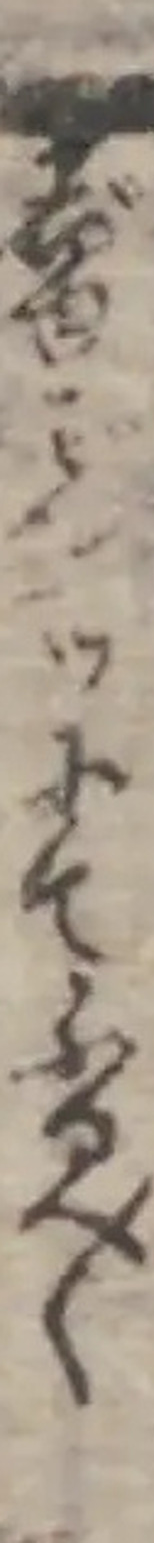じゆばん一つにてふるへ〳〵
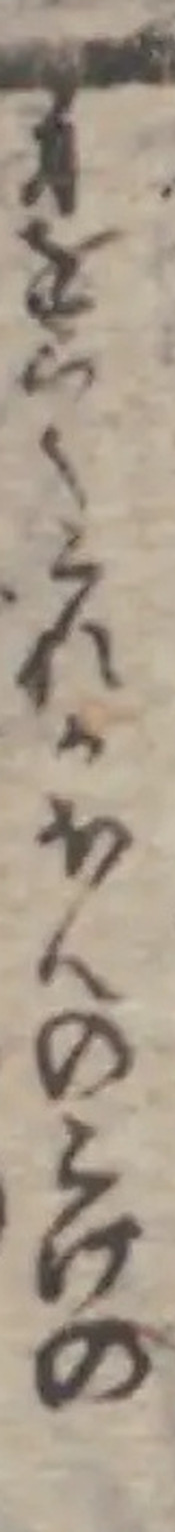舟をかくこれかほんのこけの
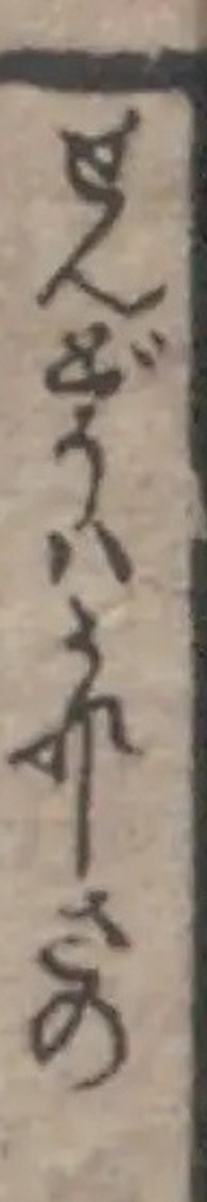せんどうはうれしさの
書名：早出来 3巻
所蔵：国立国会図書館 National Diet Library, JAPAN
